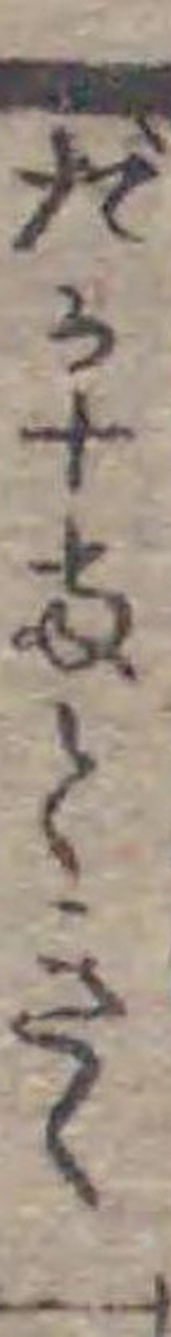だか十両ときゝ
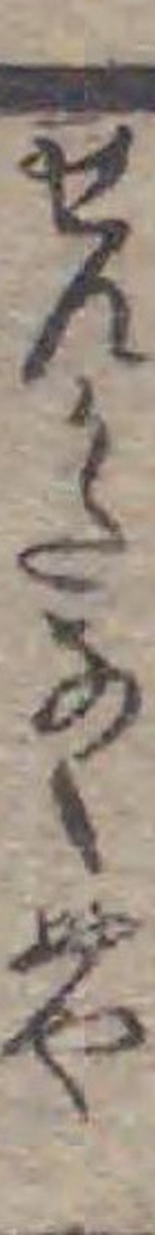せんかたなしおや
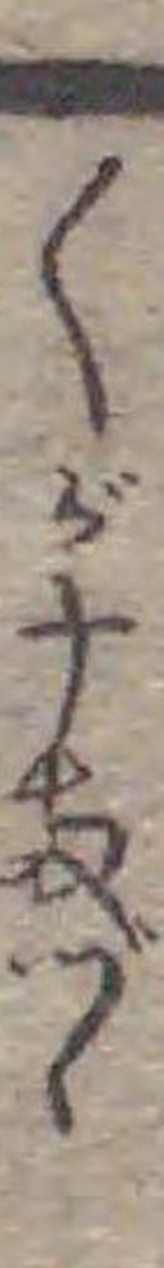〳〵が十両づゝ
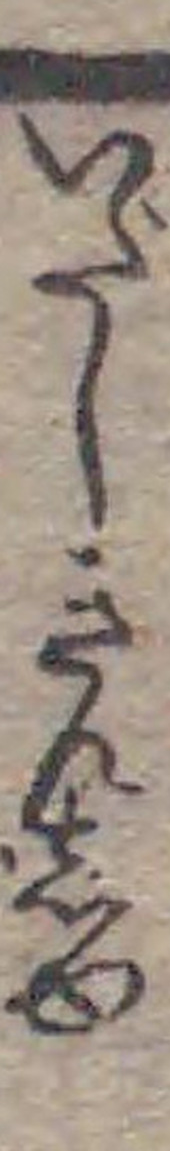いだしきんしゆ
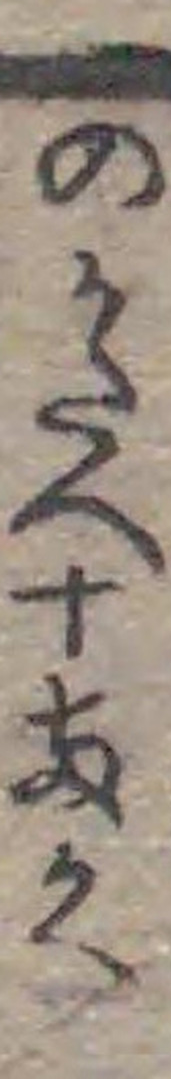のかたへ十両かへ
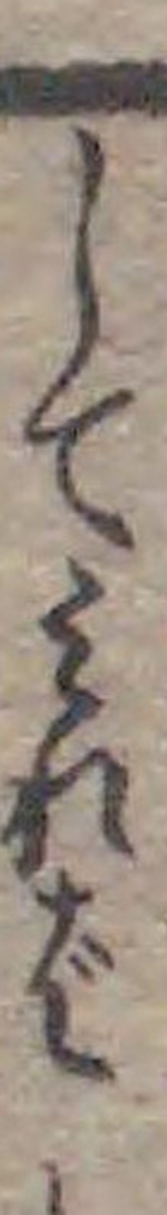してみれば
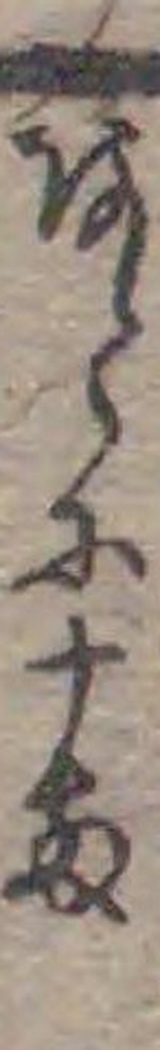あとに十両
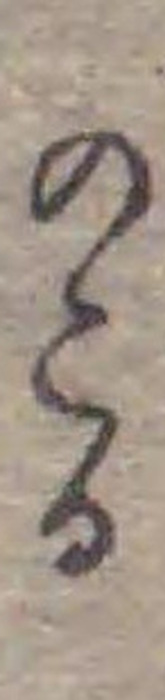のこる
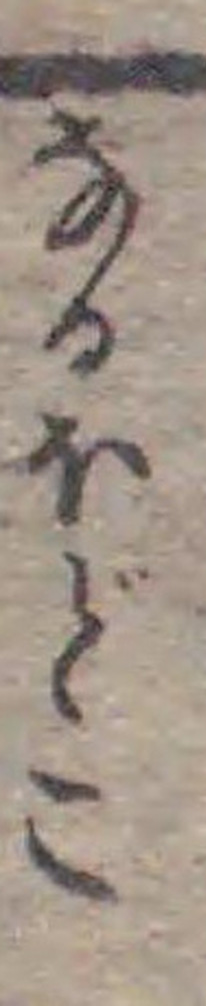なるほどこ
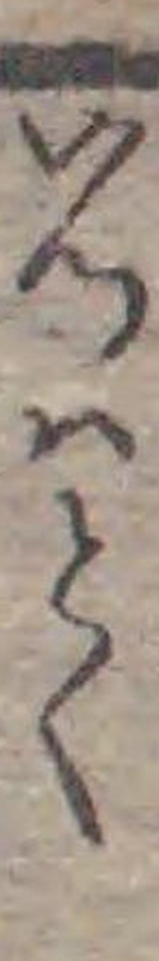いつはとく

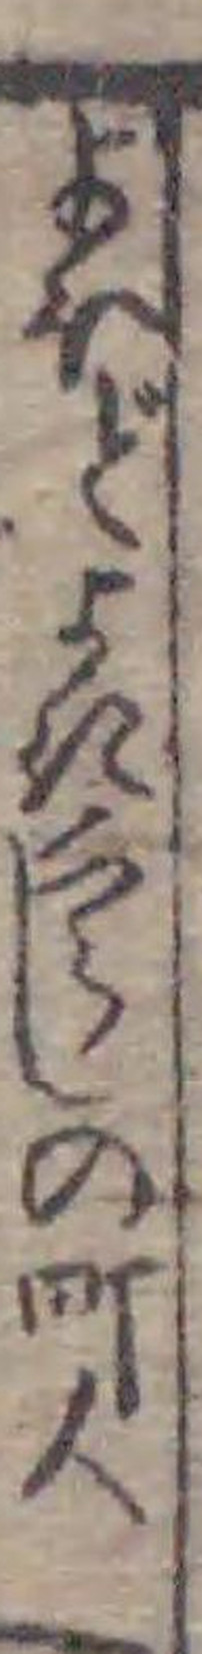よほどよきくらしの町人
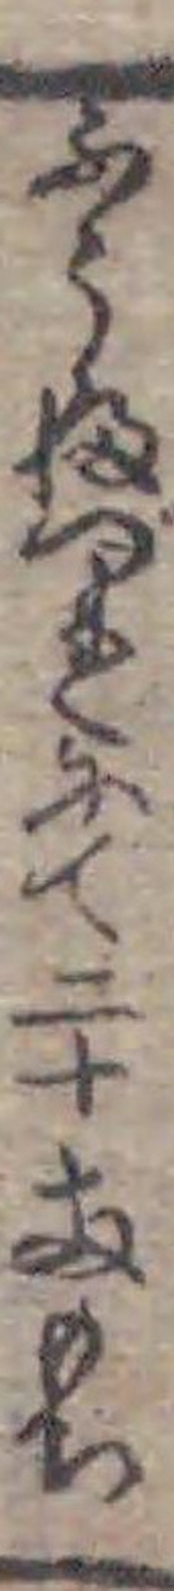ふうふづれにて二十両もち
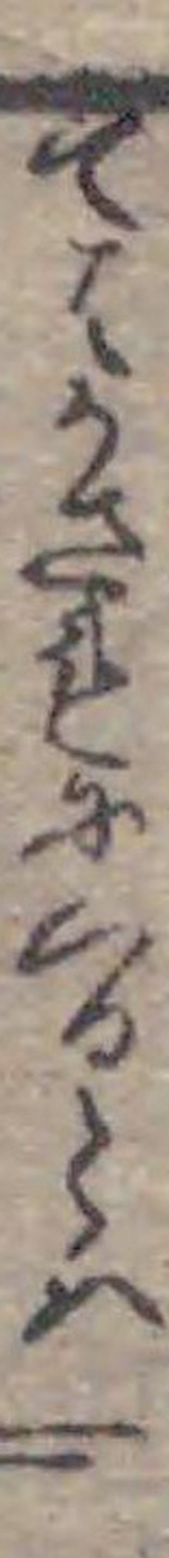てはかされにくるとは
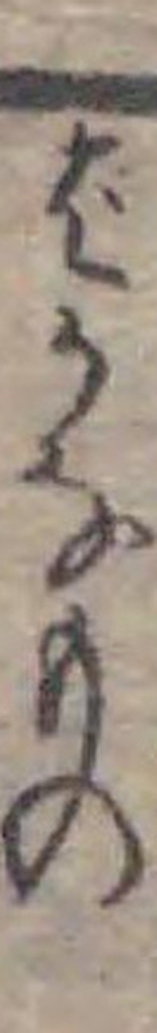ばかなもの
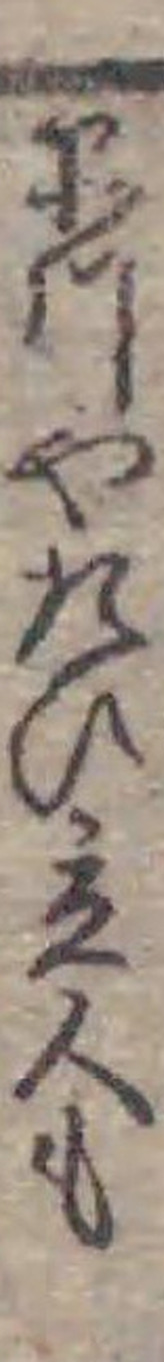品川やたひ主人も
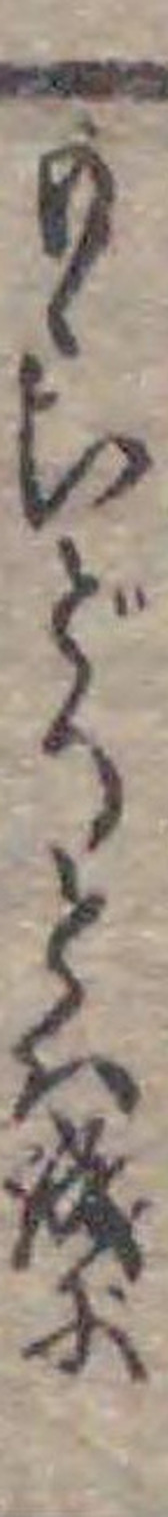もゝちどりとは誠に
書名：紺屋百物語 : 3巻
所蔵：国立国会図書館 National Diet Library, JAPAN
